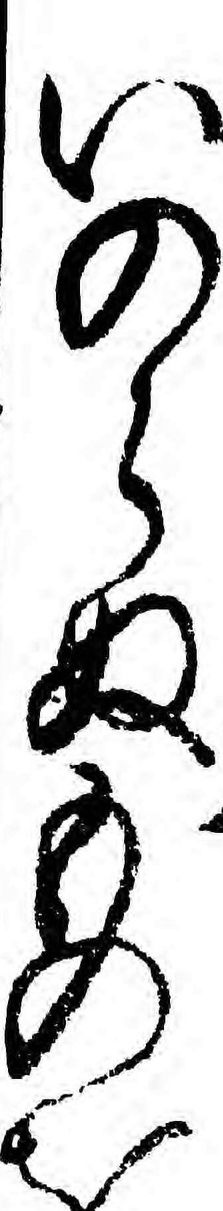いのらぬものを
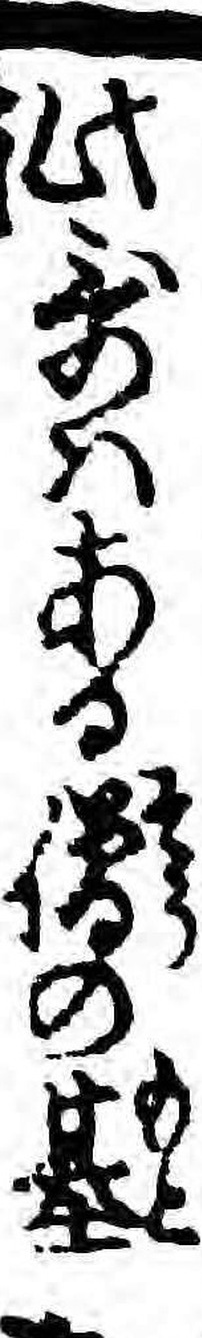此哥はある僧の基
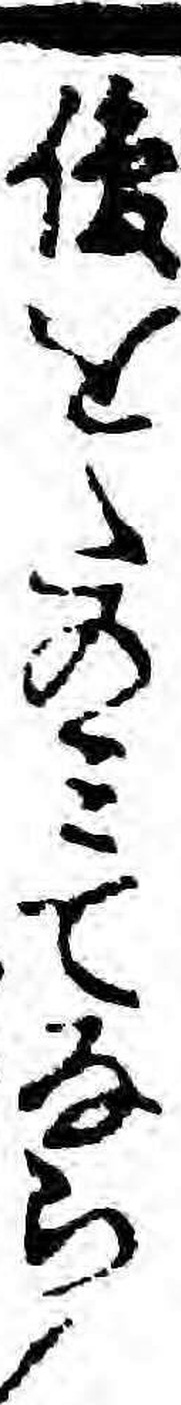俊をたのみてなら
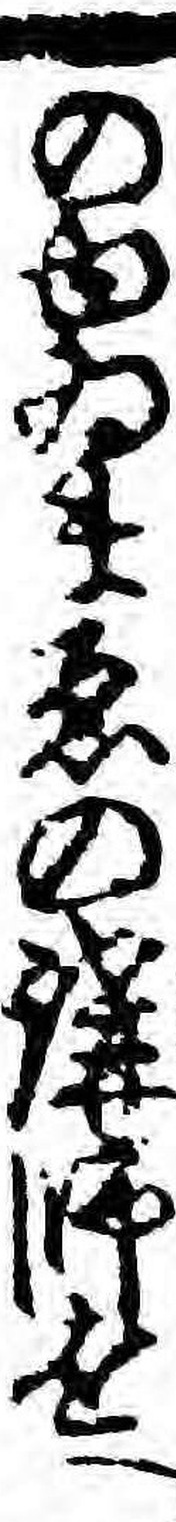のゆゐまゑの講師を
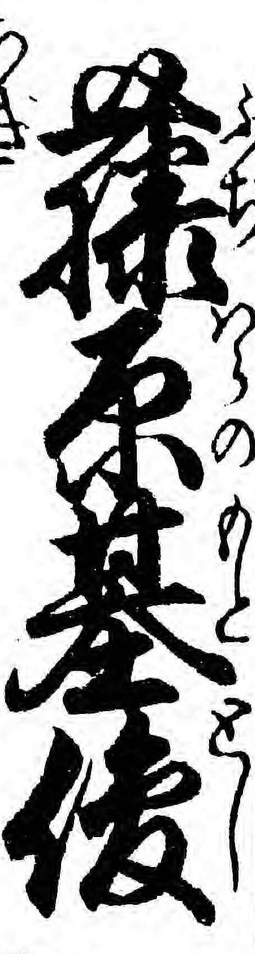藤原元俊
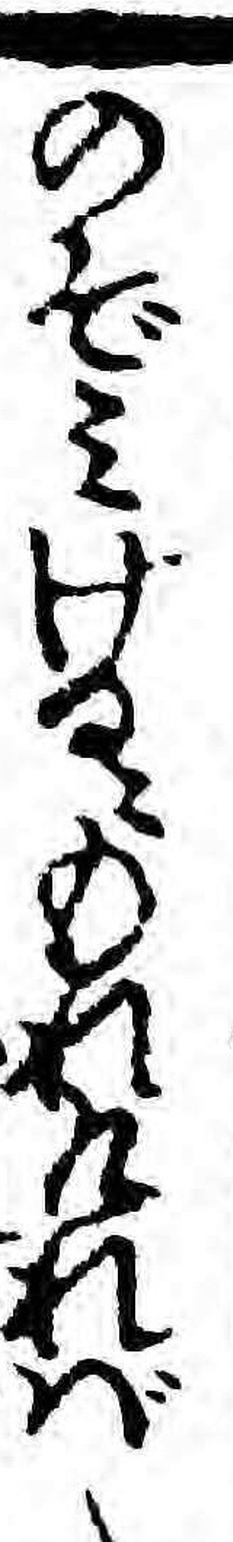のぞみけるにもれければ
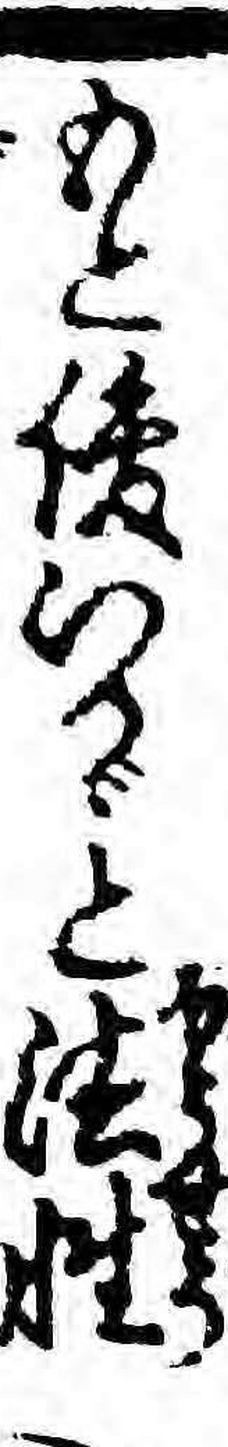もと俊いかゞと法性
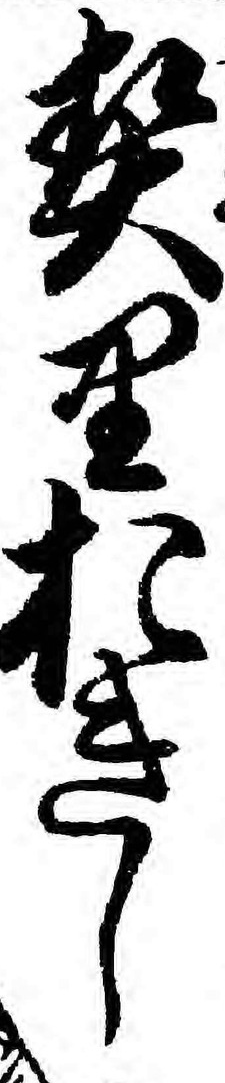契りおきし
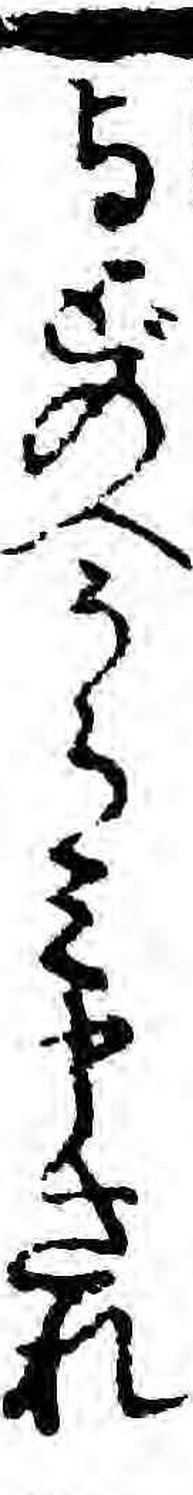寺どのへうらみ申され
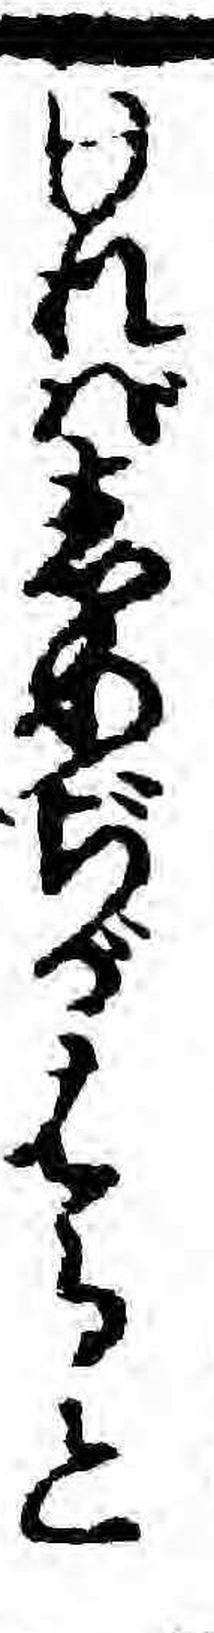ければしめぢがはらと
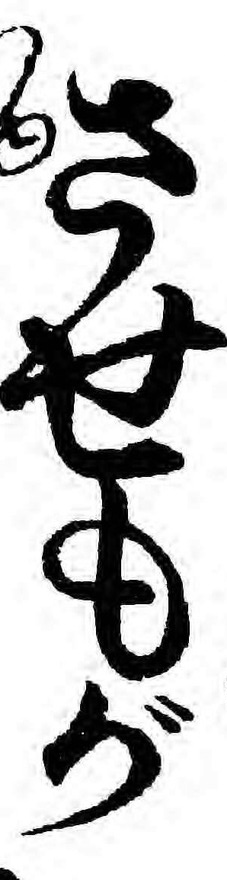させもが
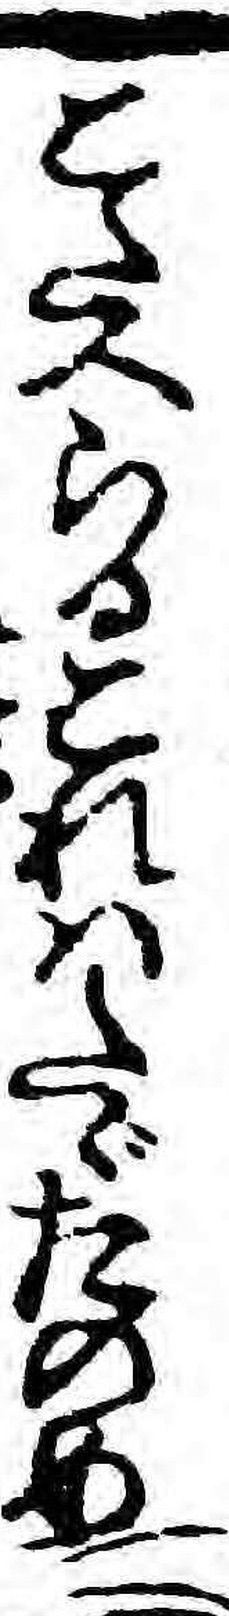こたへらるこれはたゞたのめ
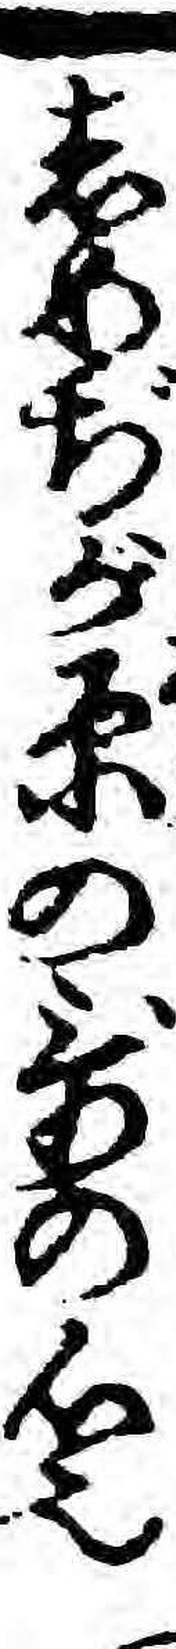しめちが原の哥の心也
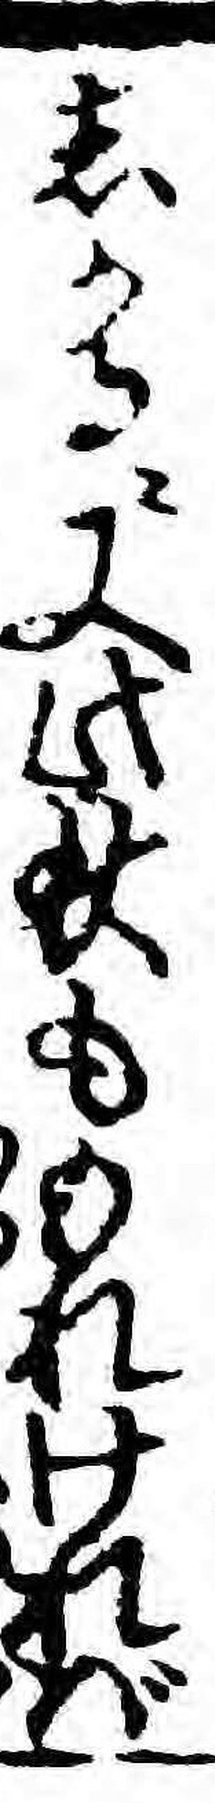しかるに又此秋ももれければ
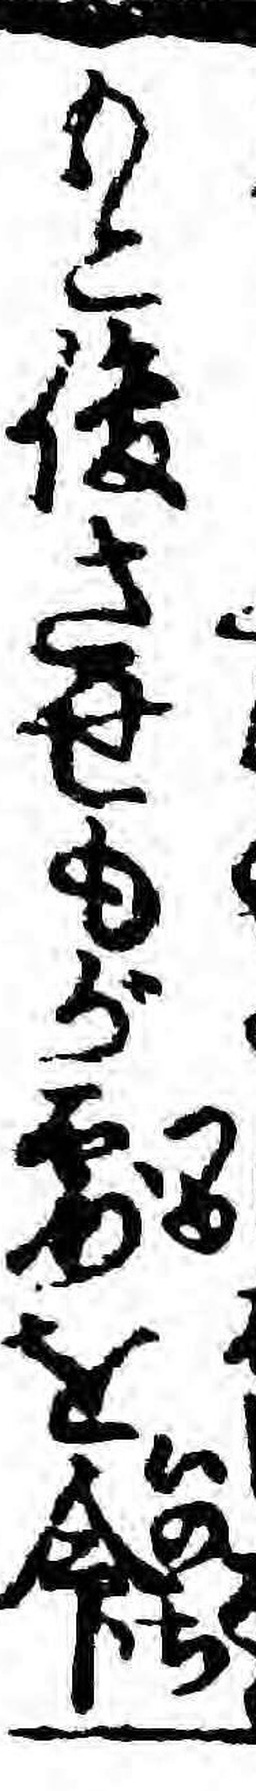もと俊させもが露を命
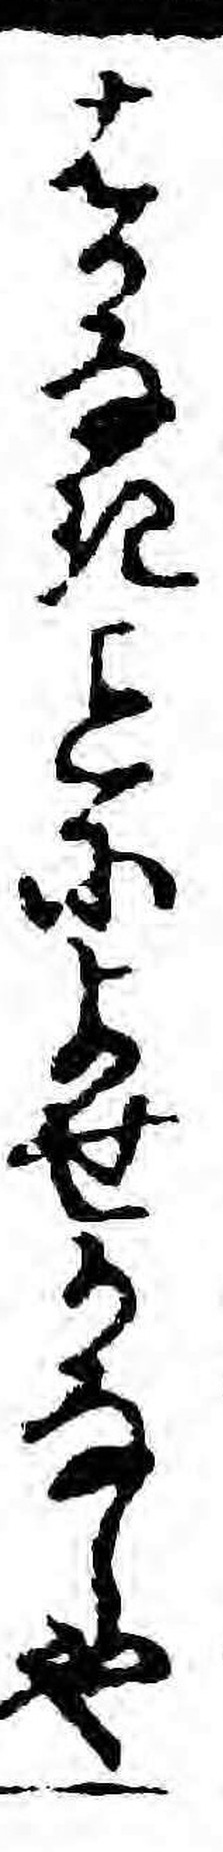はかなきことによせかなしや
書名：頭書和歌注譯／壽賀多百人一首小倉錦
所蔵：国文学研究資料館
